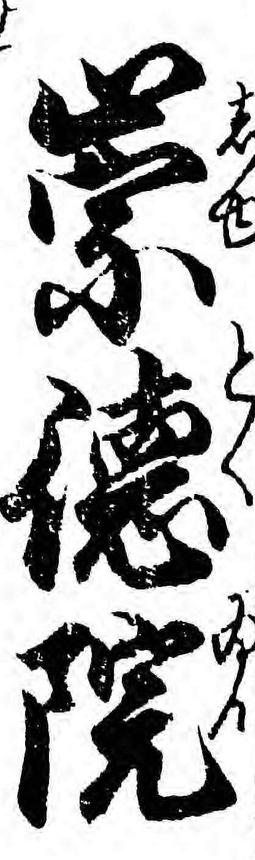崇徳院
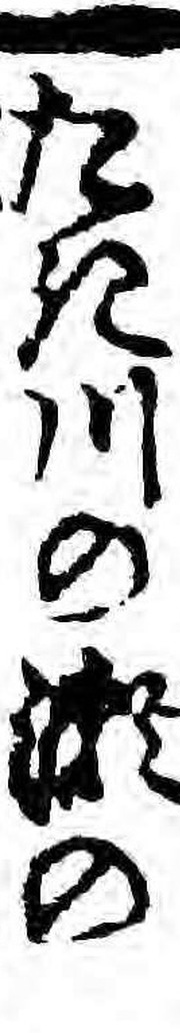たき川の瀬の
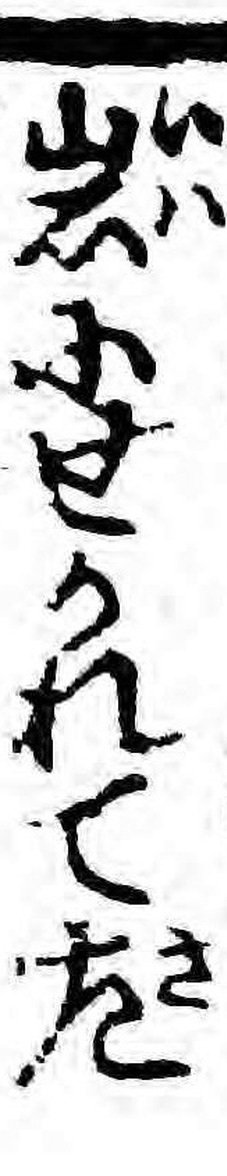岩にせかれて左
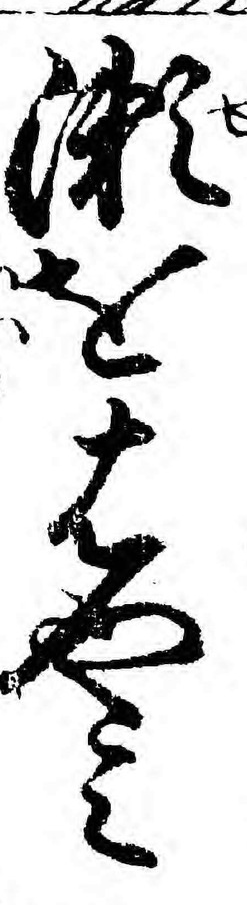瀬をはやみ
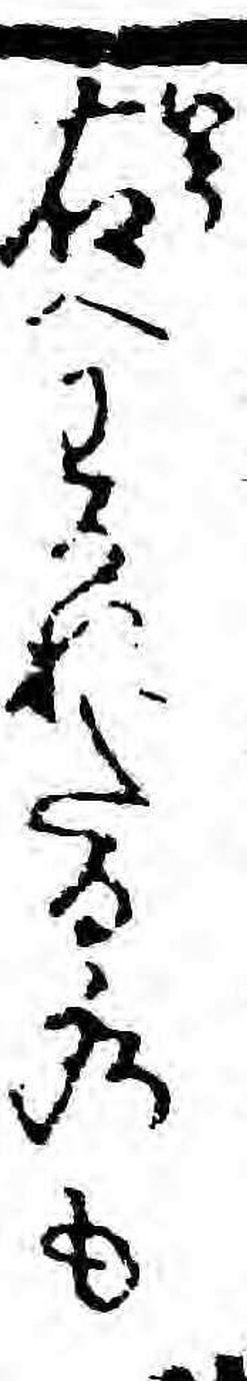右へわかれたる水も
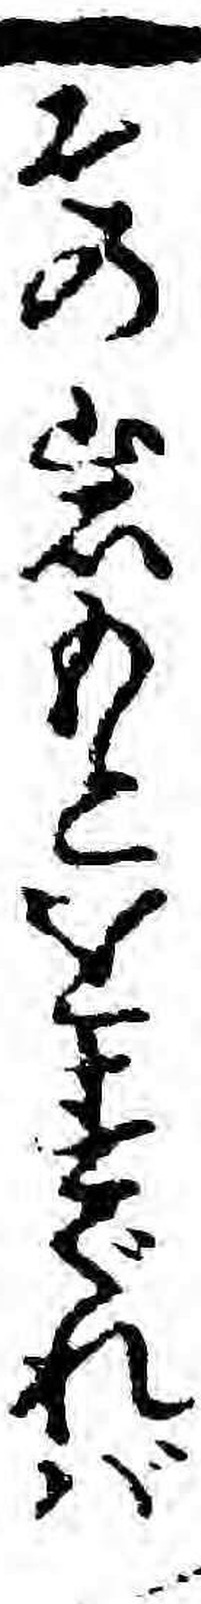その岩もとをすぐれば
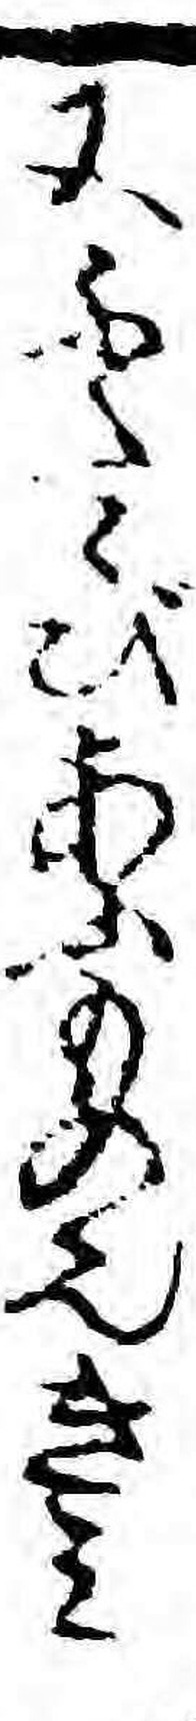又ふたたびあふもの也きみ
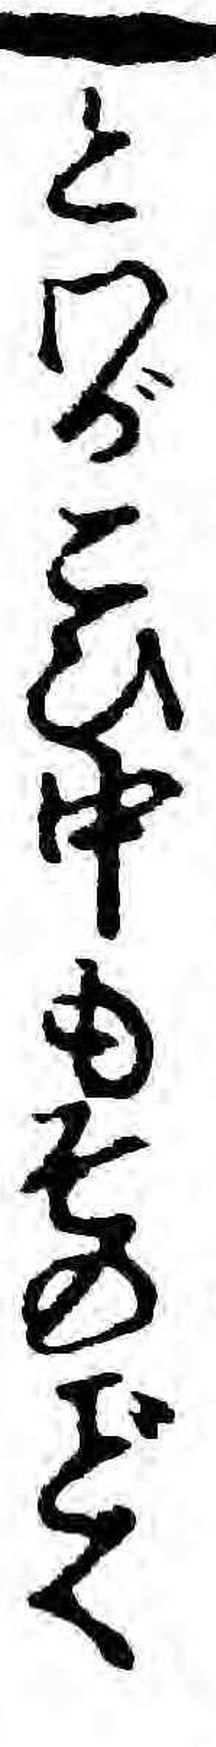とはがこひ中もそのごとく
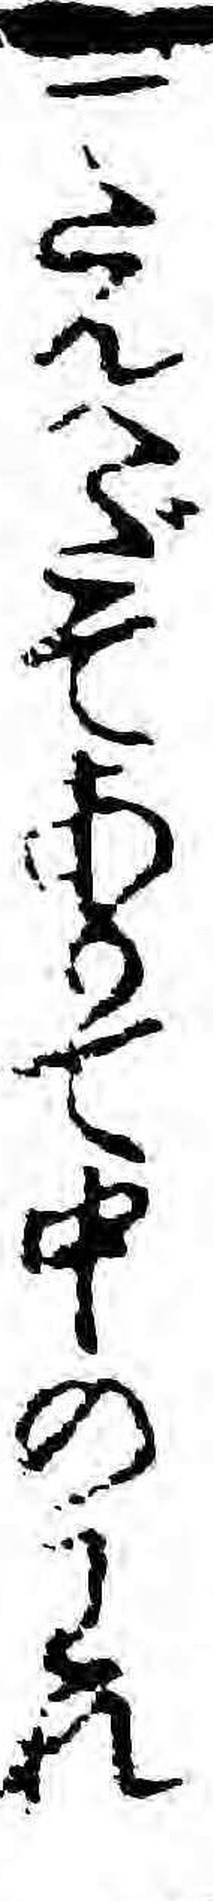一たんへだてありて中のわれ
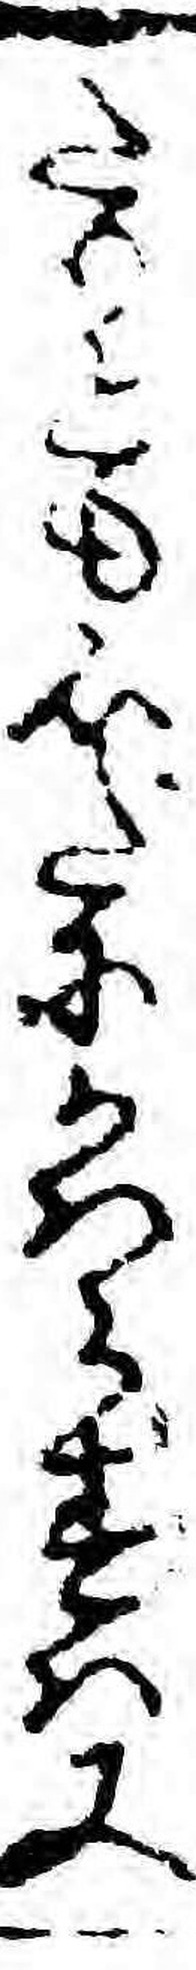たりとも心だにかはらずは又
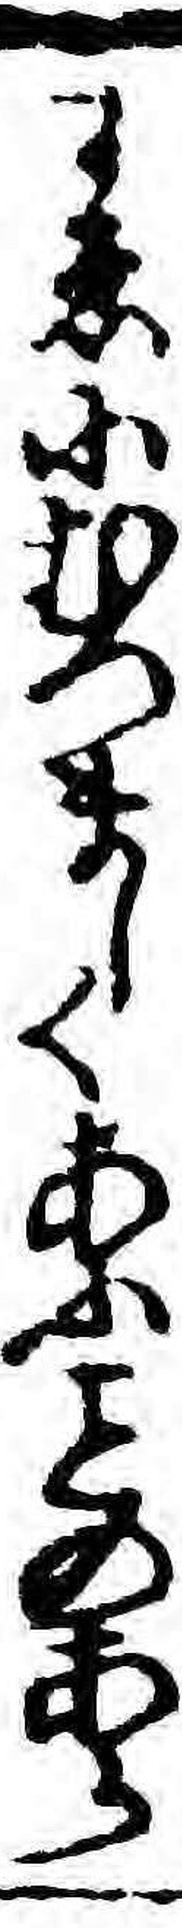すゑにむつましくあふことのあら
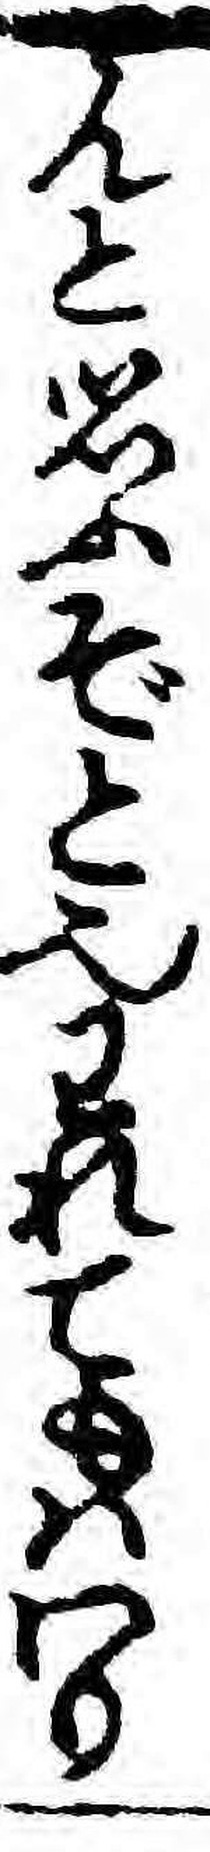んと思ふぞと也われてもはわり
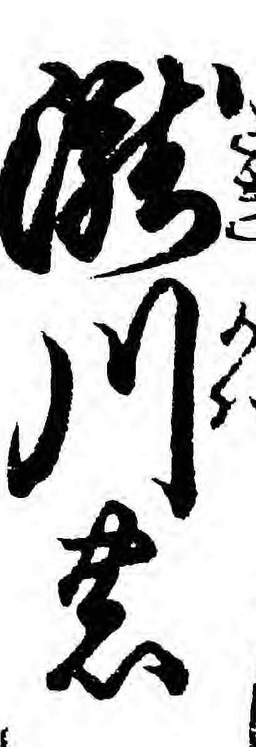瀧川の
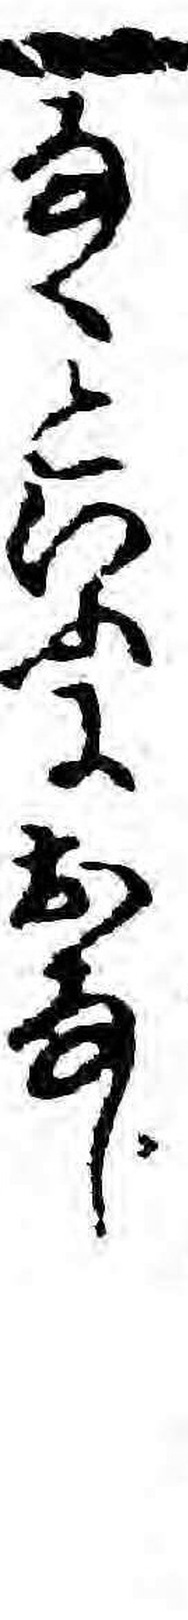なくといふにおなじ
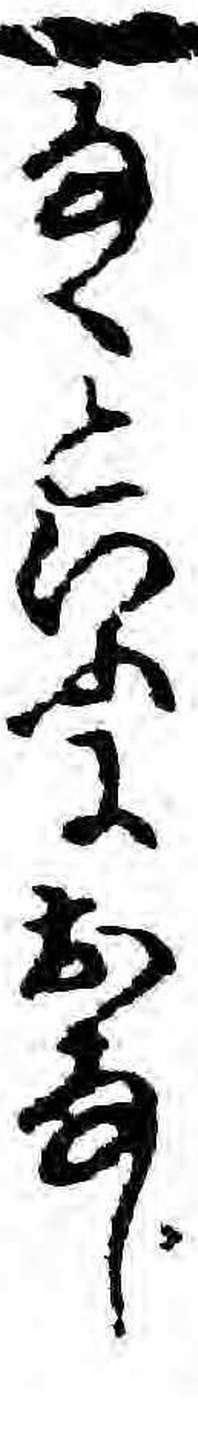なくといふにおなじ
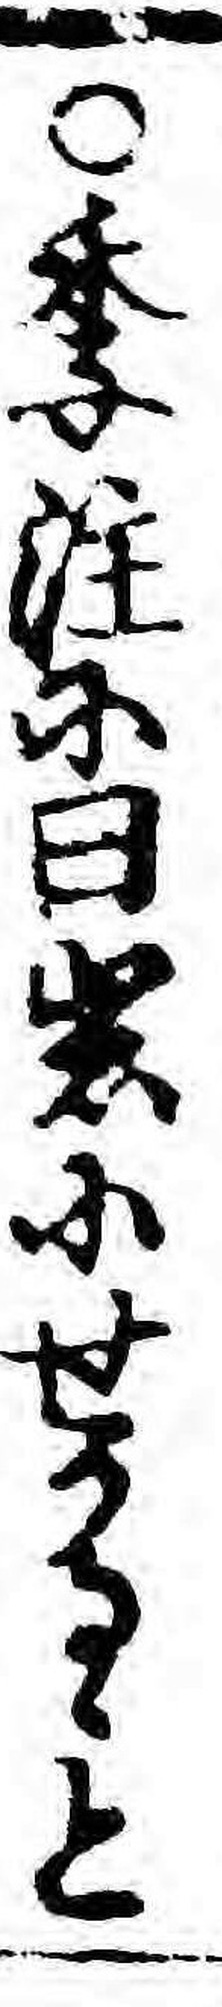〇季注に曰岩にせかるゝと
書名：頭書和歌注譯／壽賀多百人一首小倉錦
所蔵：国文学研究資料館
